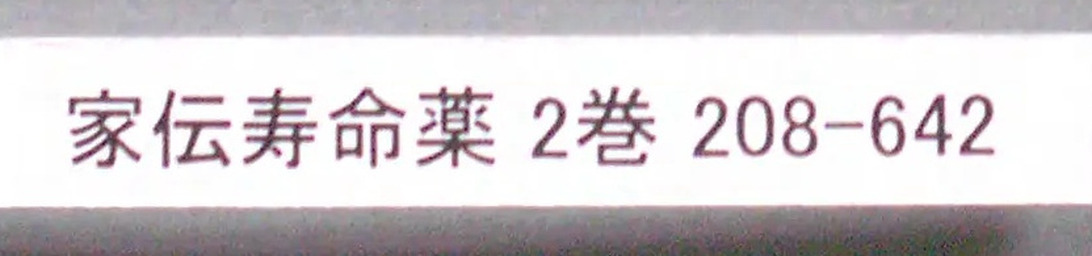家伝寿命之薬全
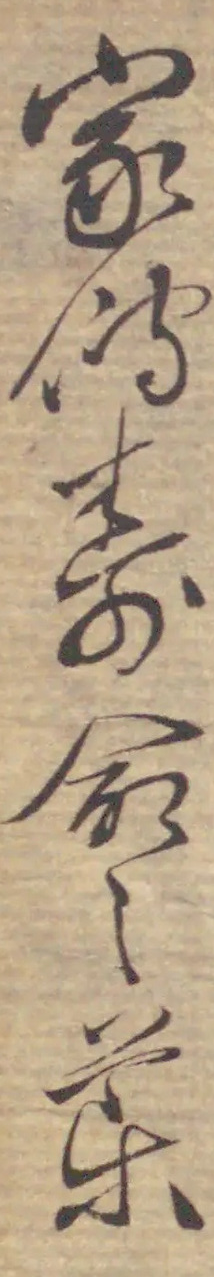家伝寿命之薬全

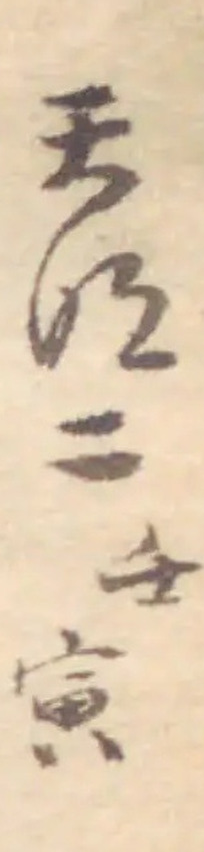天明二壬寅
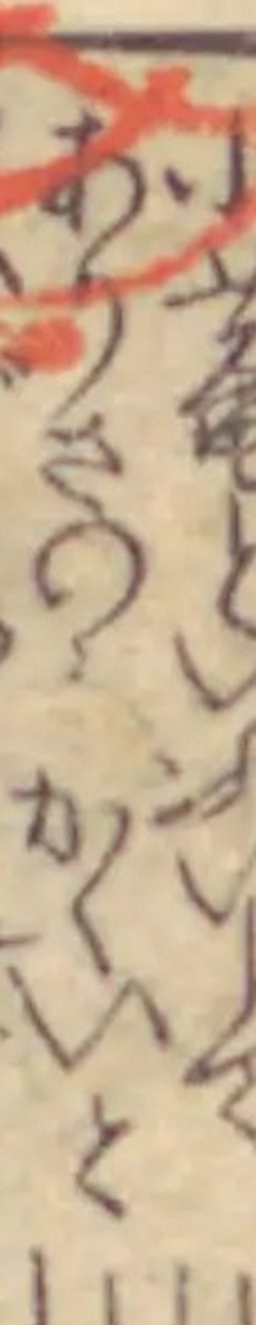ありさのみがくいと
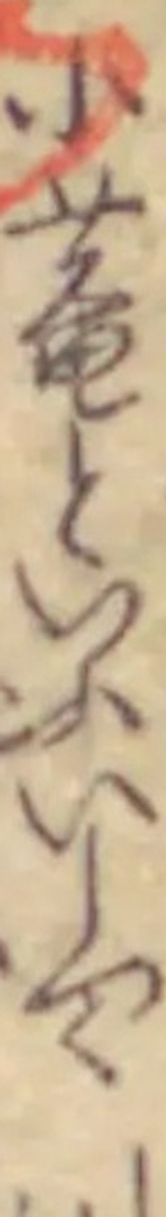小庵といふいしや
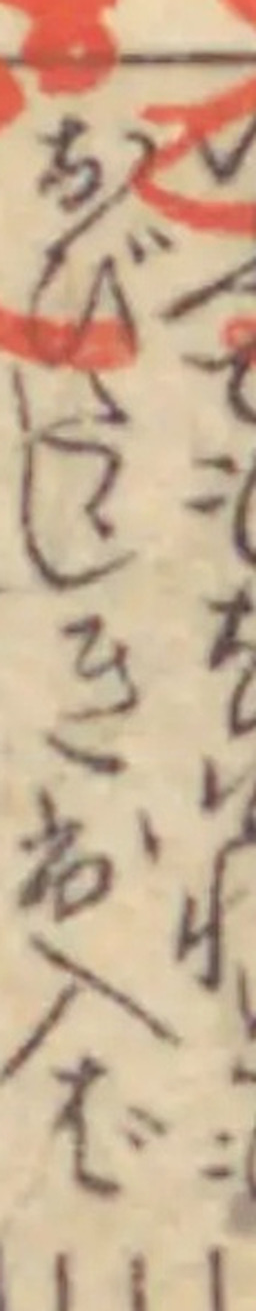おびたゝしき出入ば
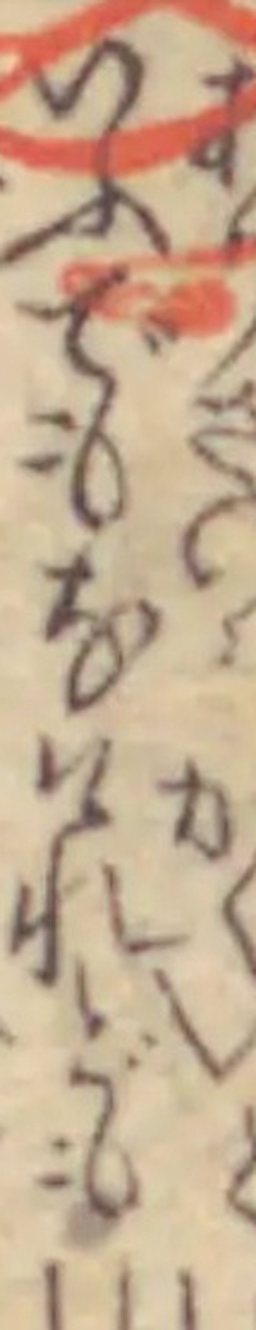いふでもなけれども
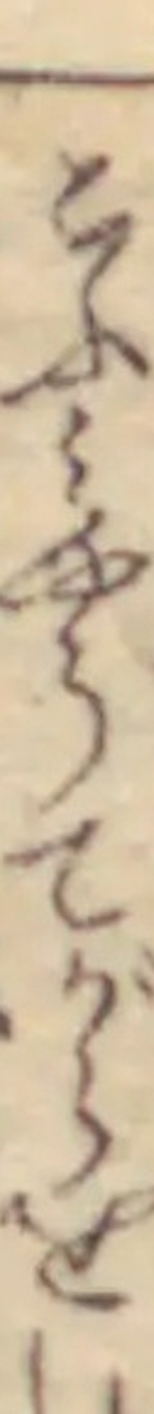こふみやうてがらを
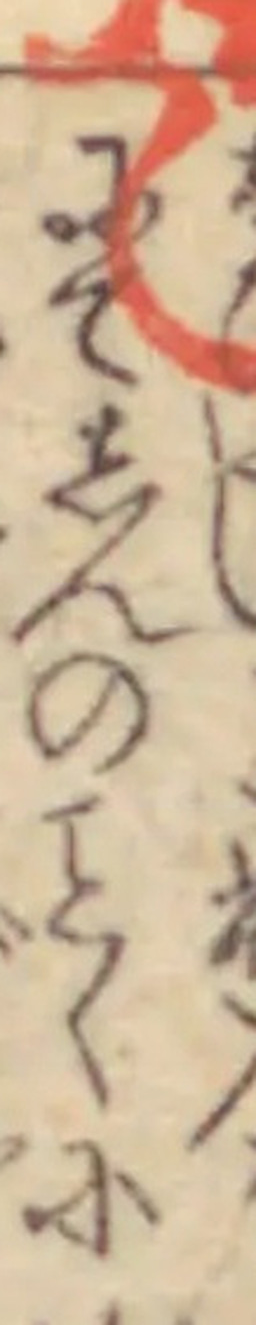にてしんのことくに
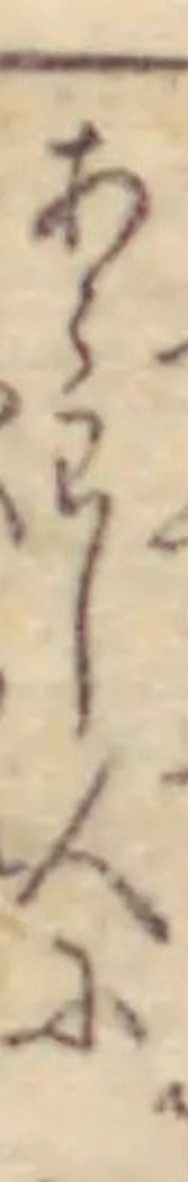あらわし人に
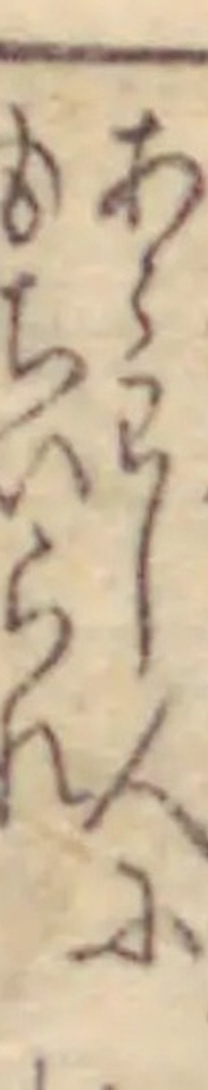もちいられ
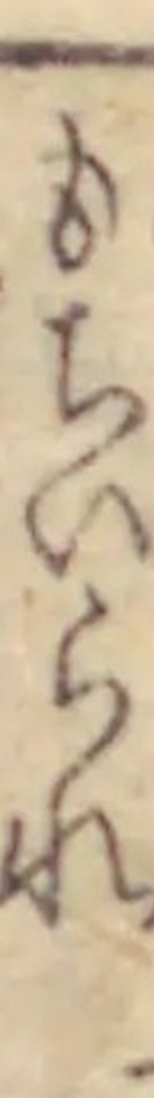もちいられ
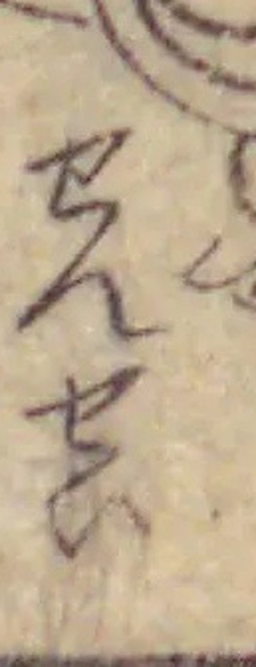せんせい
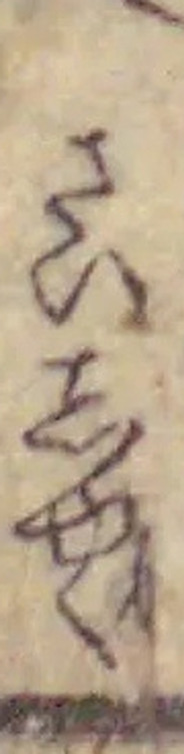さいしゆく
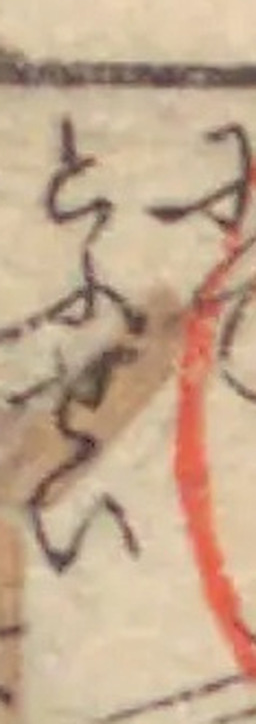とふせい
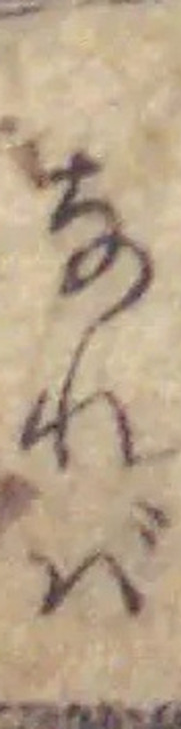なれば
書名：家伝寿命薬 2巻
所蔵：国立国会図書館 National Diet Library, JAPAN
